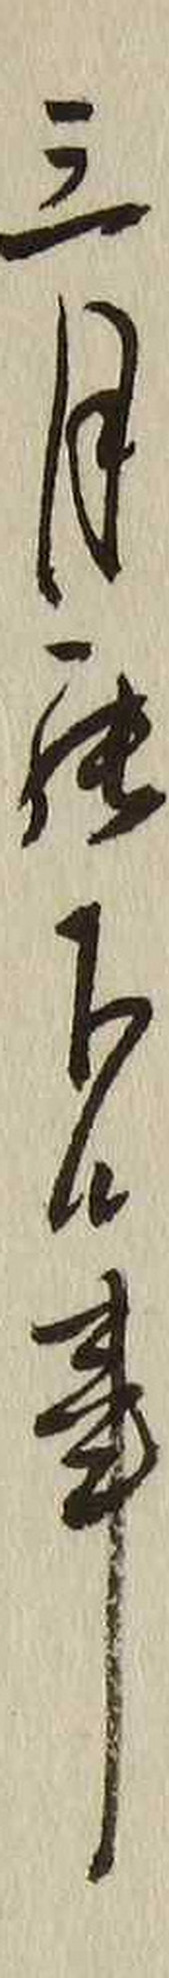三月罷下候事
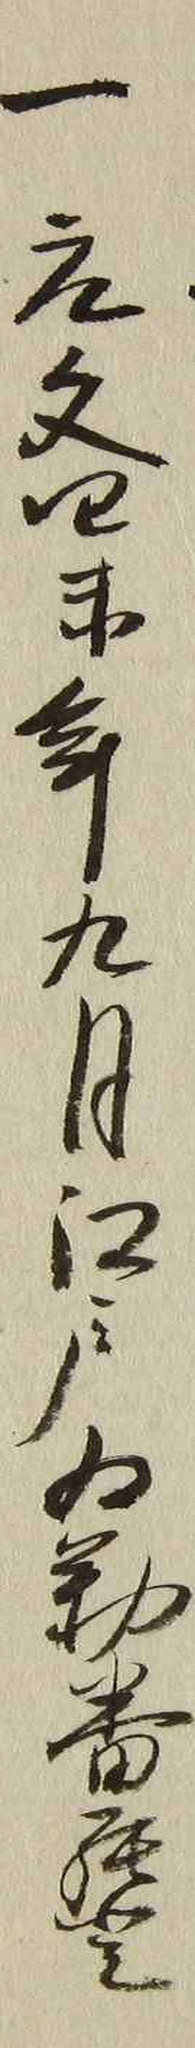一元文四未年九月江戸為勤番罷登
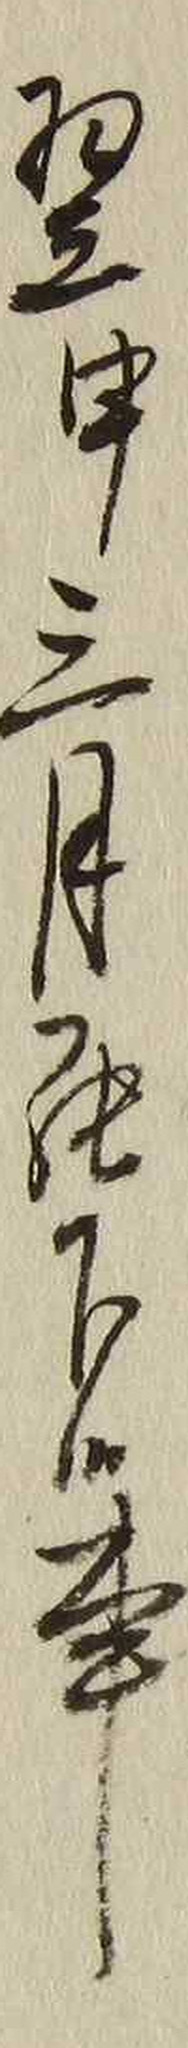翌申三月罷下候事
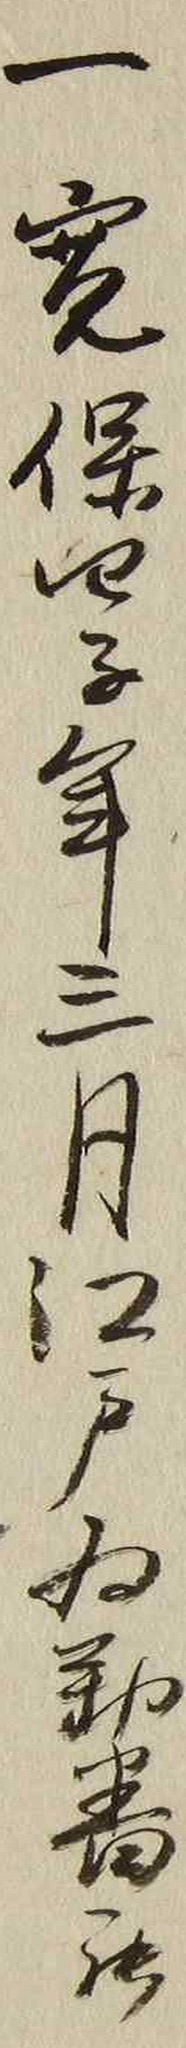一寛保四子年三月江戸為勤番罷
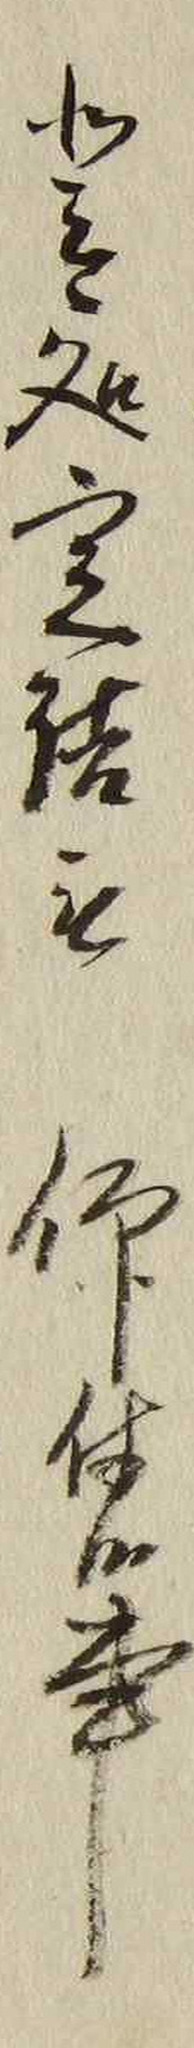登候処定詰被仰付候事
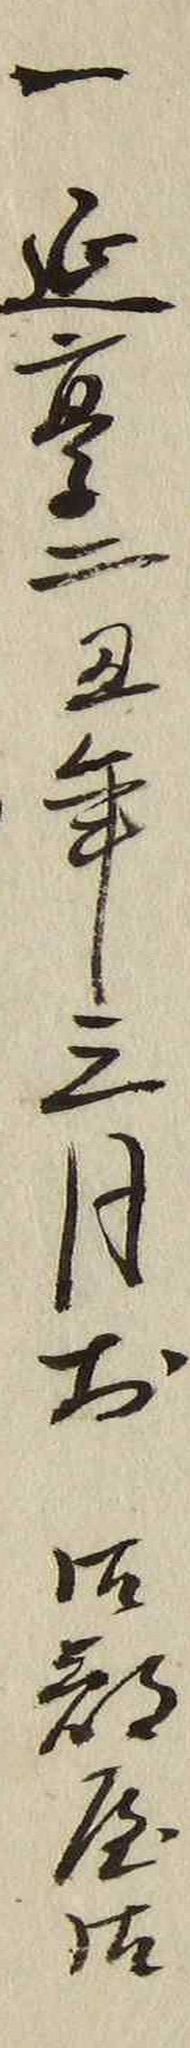一延享二丑年三月於御部屋御
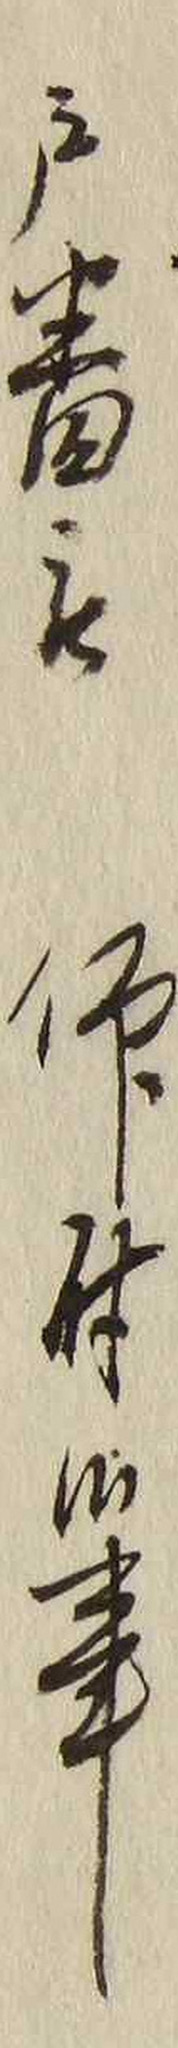戸番被仰付候事
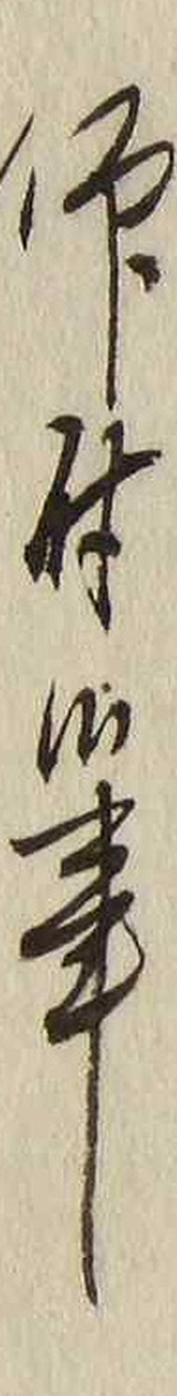仰付候事

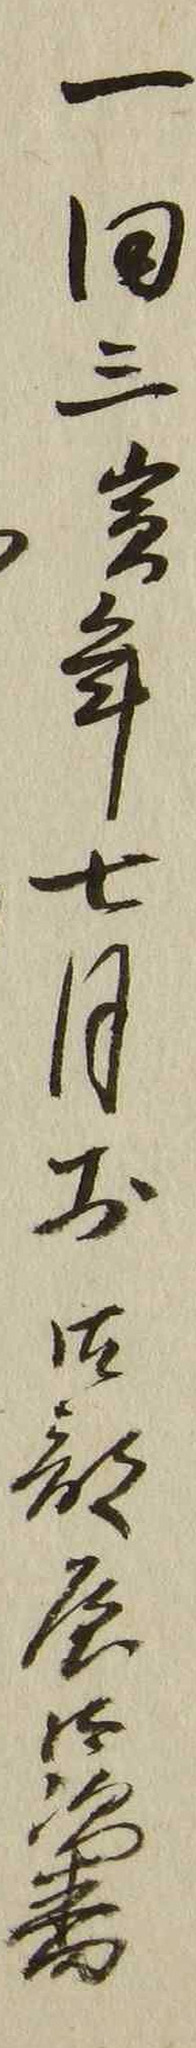一同三寅年七月於御部屋御次番
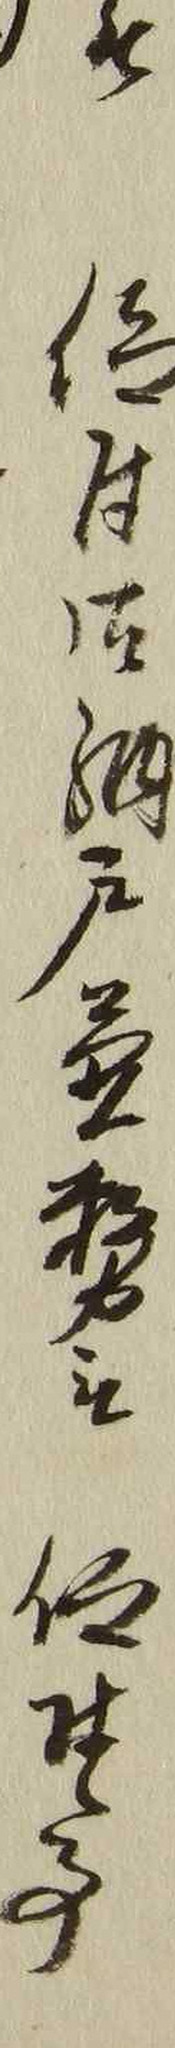被仰付御納戸兼務被仰付候事
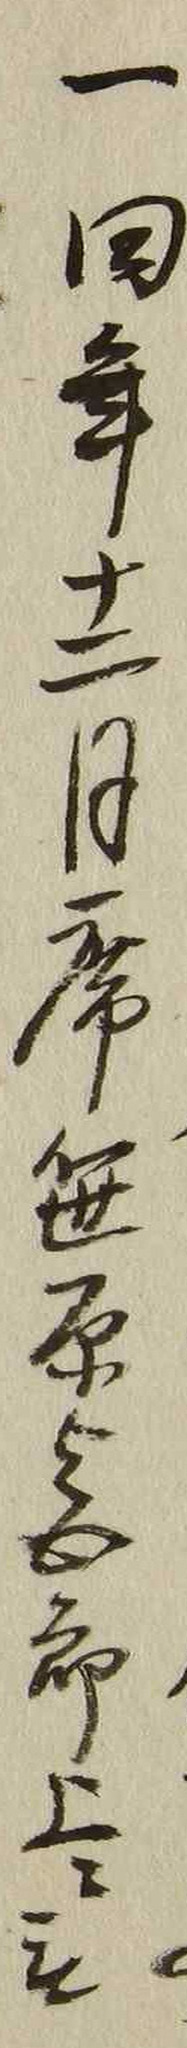一同年十二月席笹原与五郎上ニ被
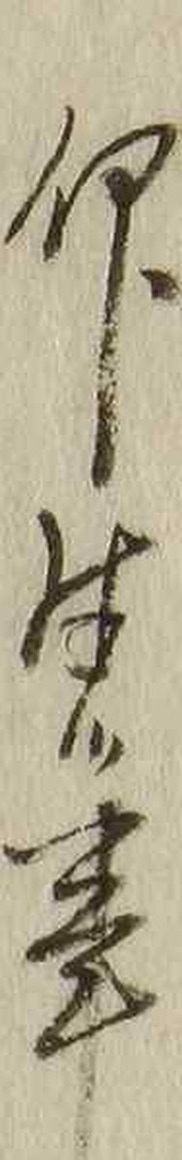仰付候事
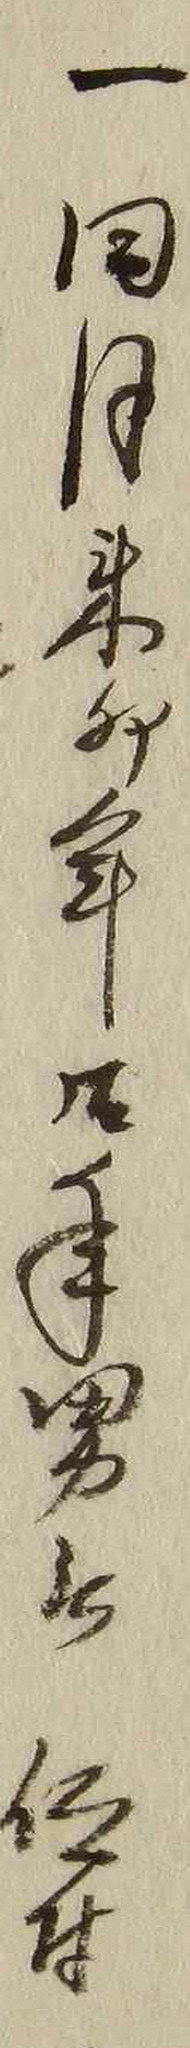一同月来卯年御年男被仰付
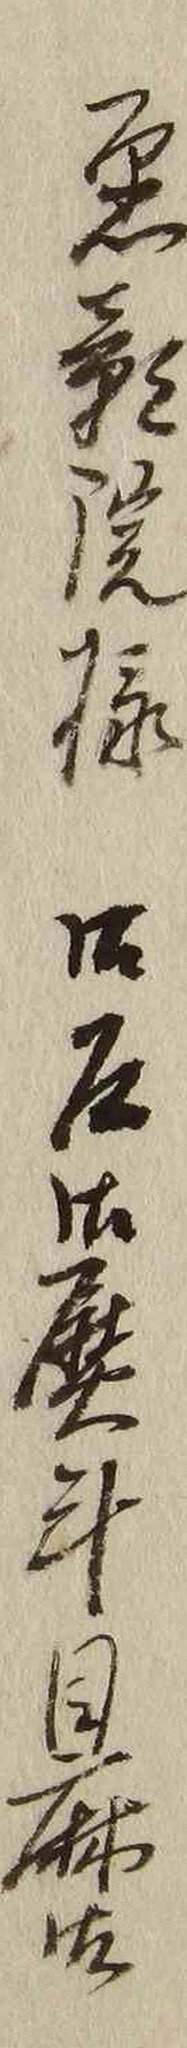愿彰院様御召御熨斗目麻御
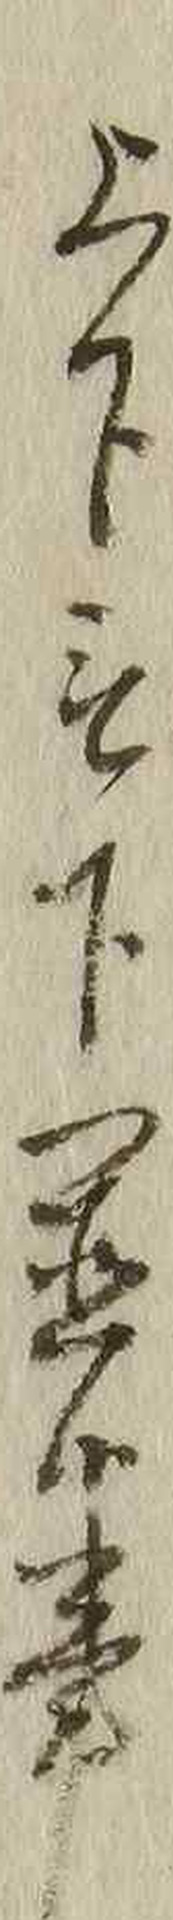上下被下置候事
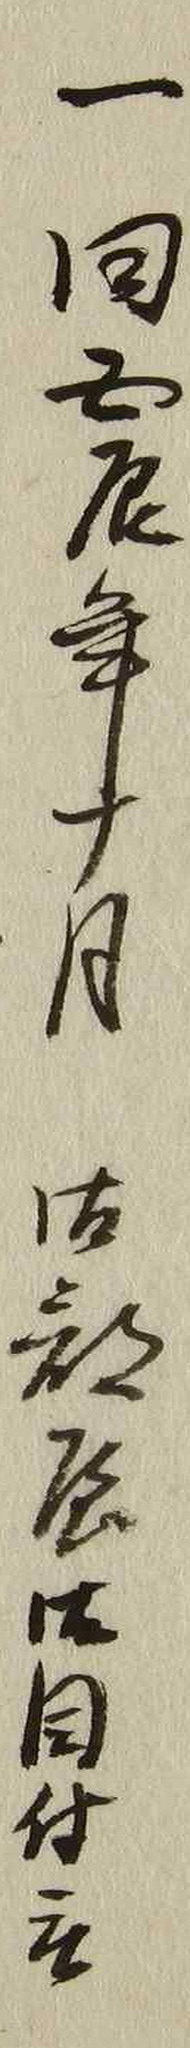一同五辰年十月御部屋御目付被
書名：諸士系譜　巻之349　も之部5
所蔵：会津若松市立会津図書館
